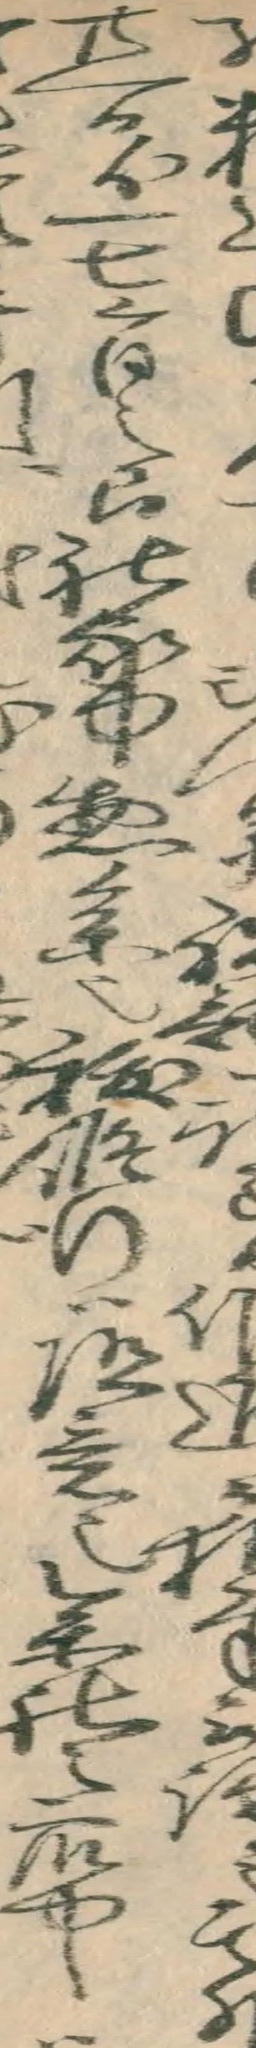廿一日ゟ一七ケ日之間社家中惣参也祓修行ハ随意也参社之衆中ハ
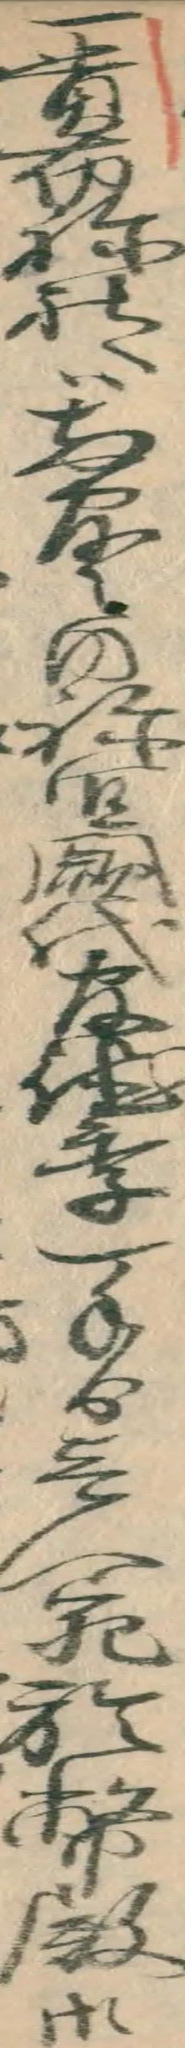一貴布祢社へハ両官之内祢宜闕代官徳季一手ゟ壱人宛於幣殿御
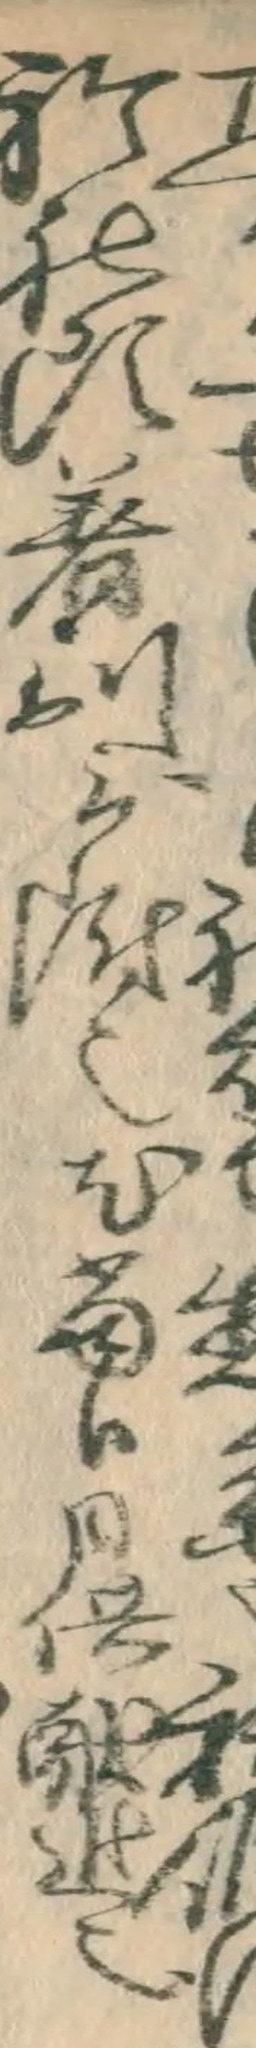於社頭着到ニ被付也尤当日日供献進也
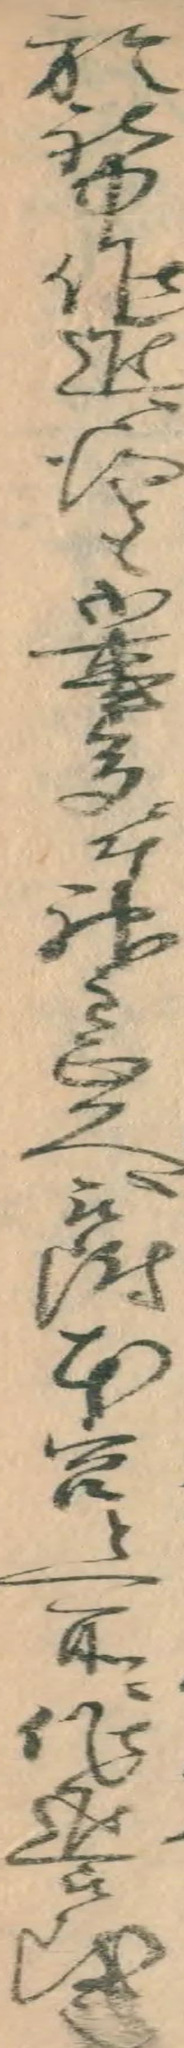於社中作進候得とも御事多ニ付神主正久へ被付本宮と一所ニ作進被致也

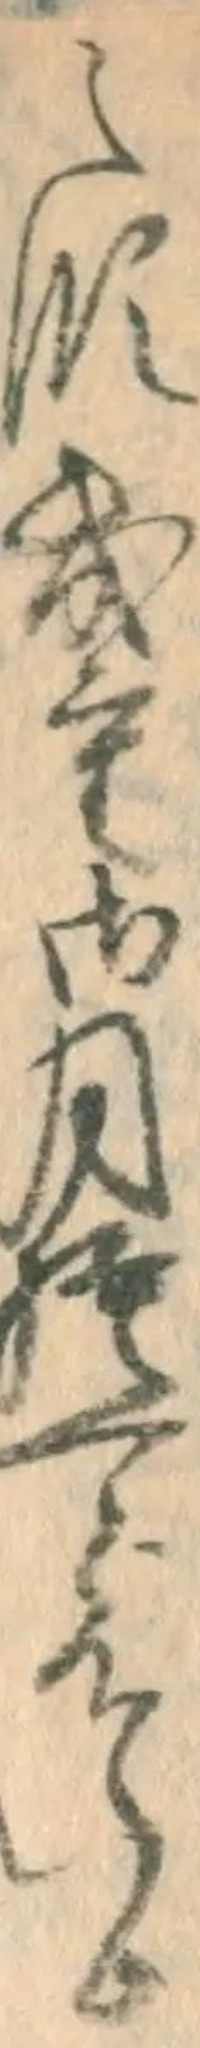之段幾重御用捨可被下候以上
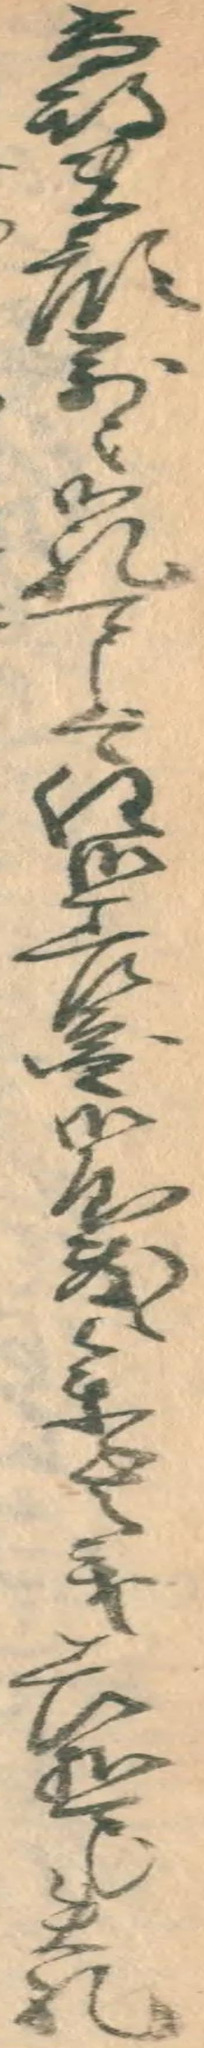尚期貴顔万々御礼可申上候任御差図御屋敷へ参上之義差可申候失礼
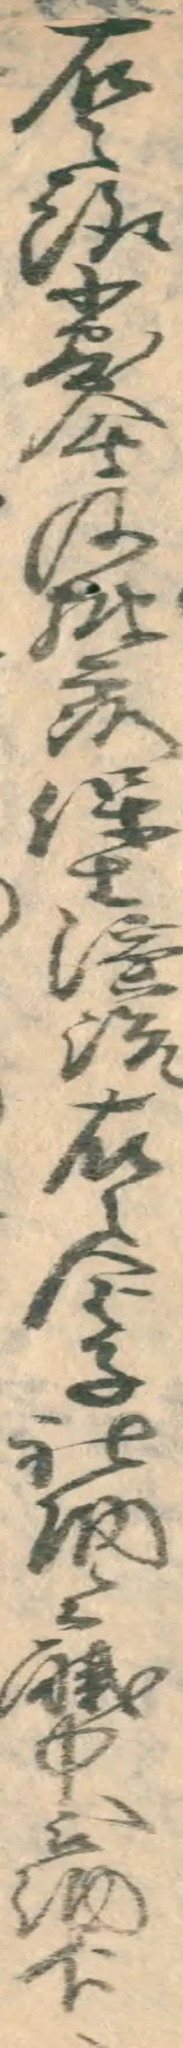右之趣小寄会及披露保土演説右之金子社納候而職中へ被納被下候
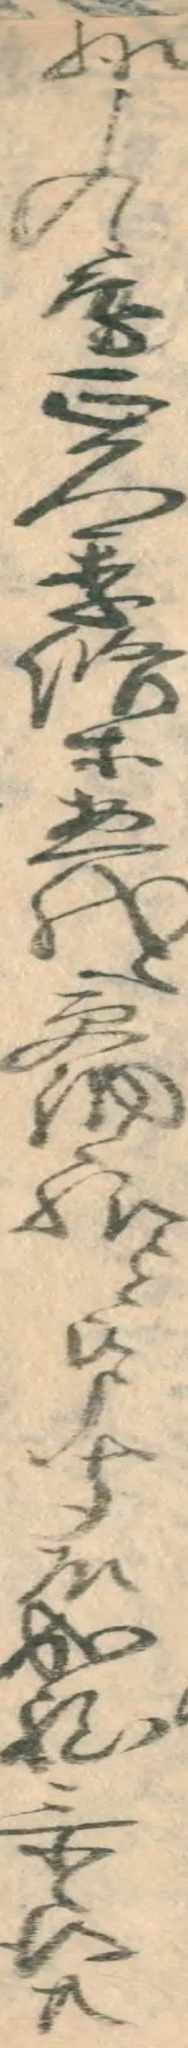様申入候処正久季脩等惣代へ受納候様と被申聞故成程忝候得共
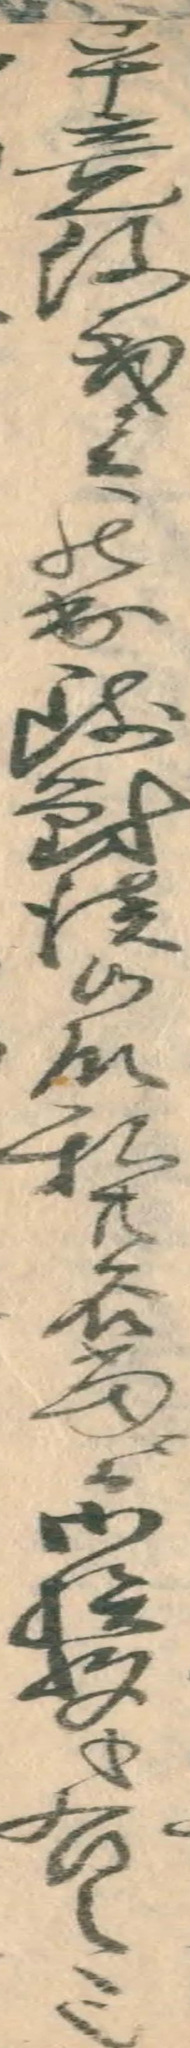畢竟役義ニ而罷出致対談候故私共名当ニ而御挨拶も有之候也
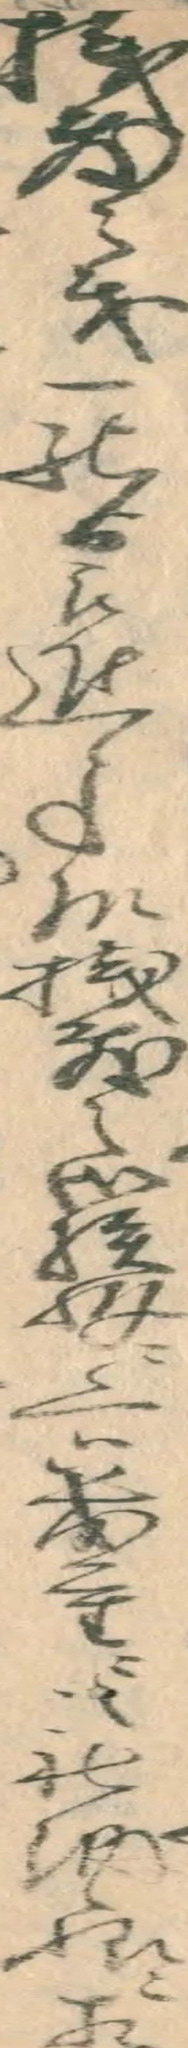桟敷之義一社ゟ被進候事故桟敷之御挨拶ニ候へハ幾重ニも社納之様ニ相
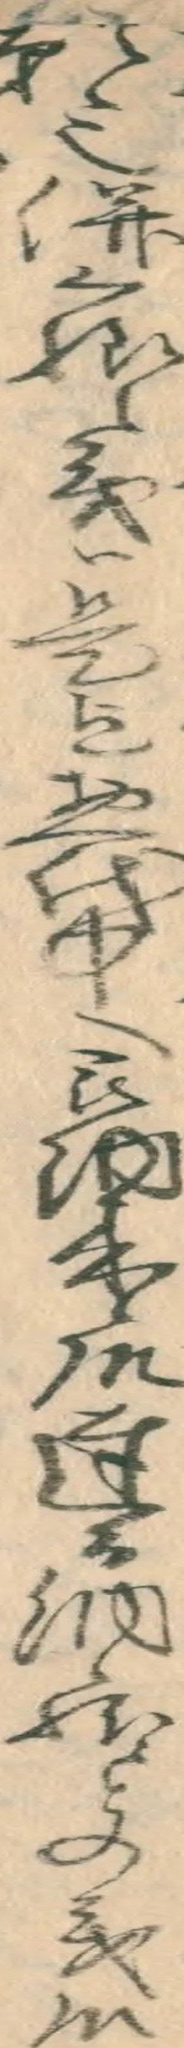願候也併ケ様之義ハ是迄惣代中へ被納来候故達而納候様ニとの義故
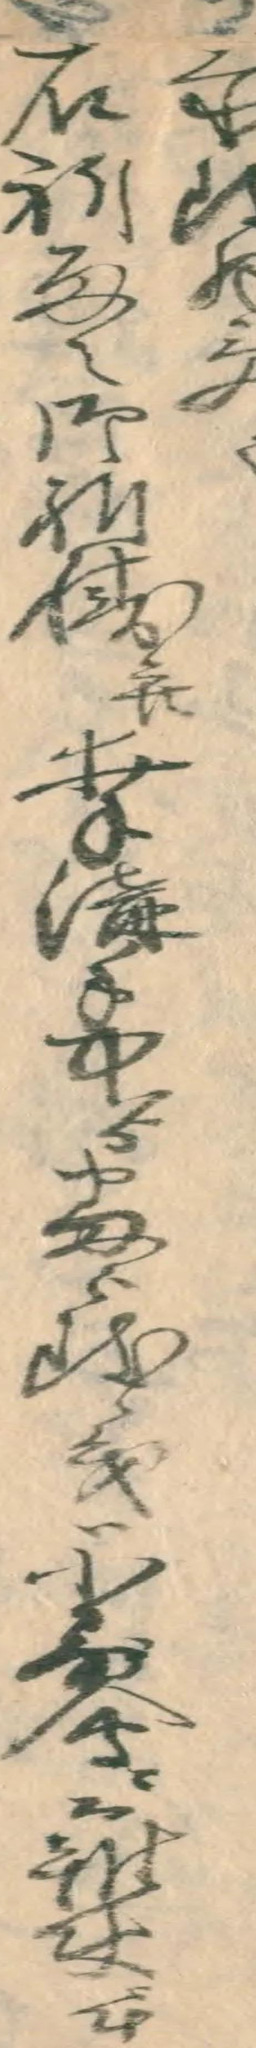一右祈雨之御祈祷并井手溝手中ゟ番被致候義ハ小寄会ニ而難決ニ付
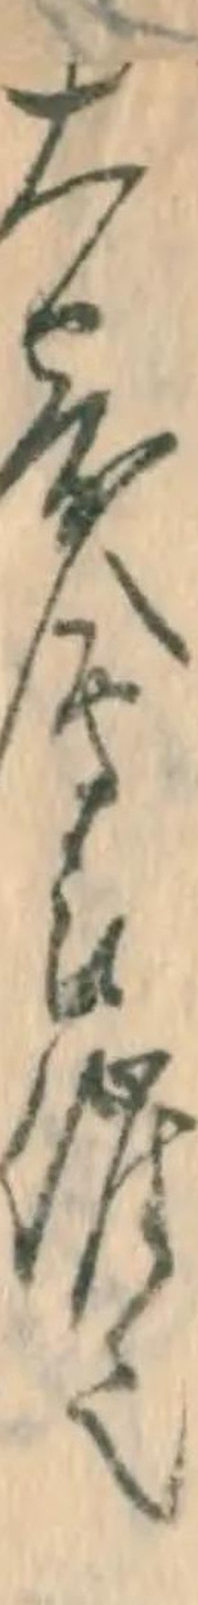大寄会被催也
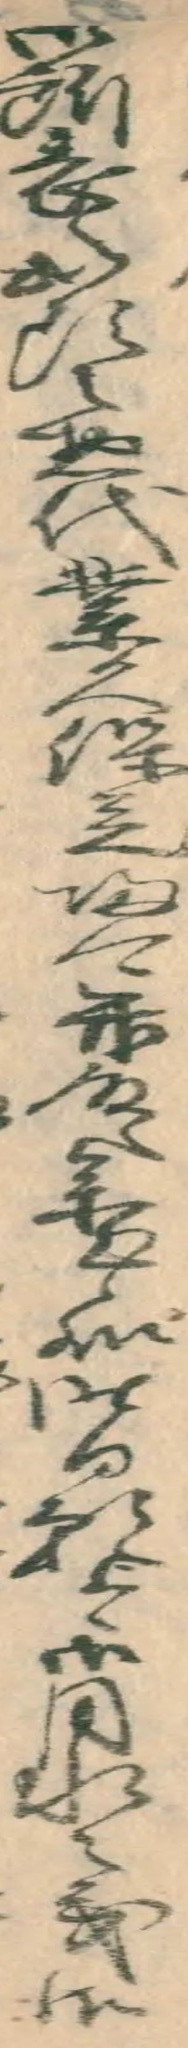一御所表へ出頭之惣代業久保覚帰郷弁殿へ参上候処昨日願上候御用水之義御
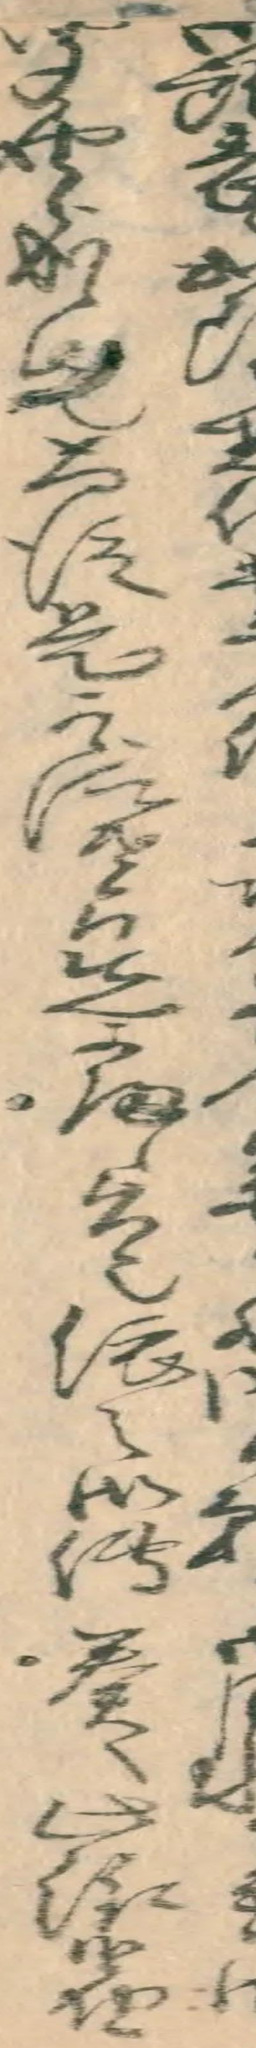聞届被成候由也尚従是可被仰遣候間先被帰候旨也依之御伝奏へ此趣御届
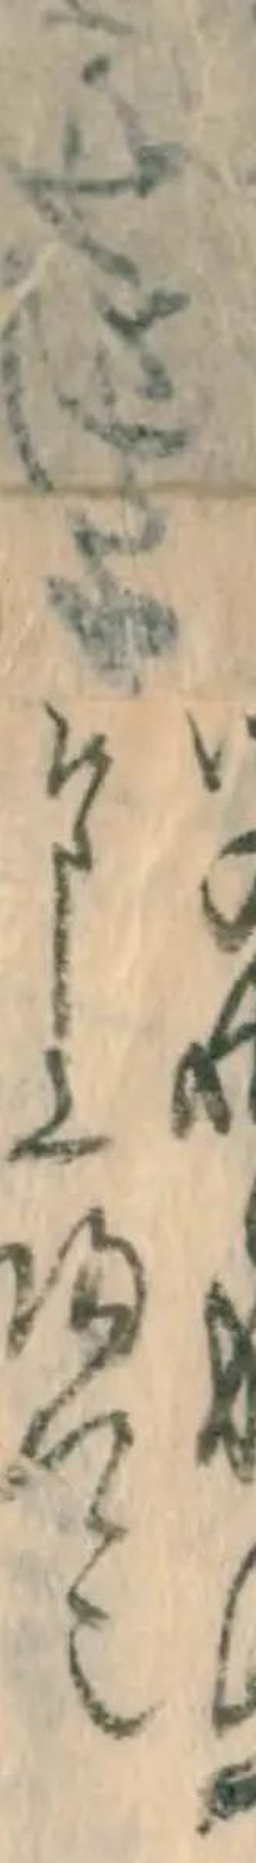被申上帰郷也
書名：賀茂社記録. 第58冊
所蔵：国立国会図書館 National Diet Library, JAPAN
